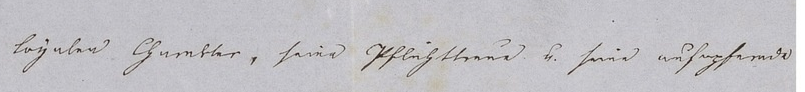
loyalen charakter, seine Pflichttreue u. seine aufopfernde
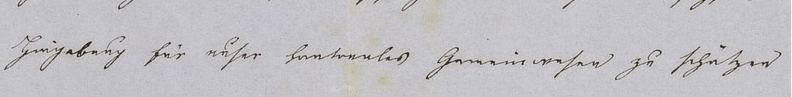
Hingebung für unser kantonales Gemeinwesen zu schätzen
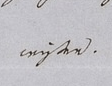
wissen.
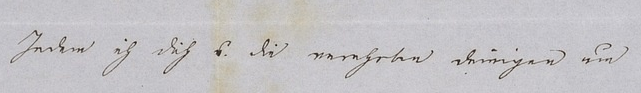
Indem ich Dich u. die verehrten Deinigen um
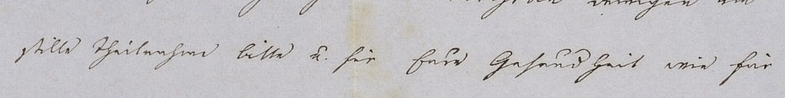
stille Theilnahme bitte u. für Eure Gesundheit wie für
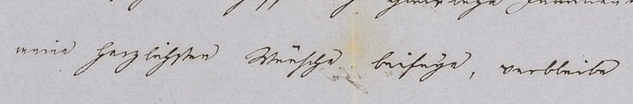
meine herzlichsten Wünsche beifüge, verbleibe
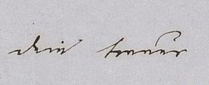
Dein treuer
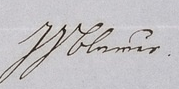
J J Blumer.
